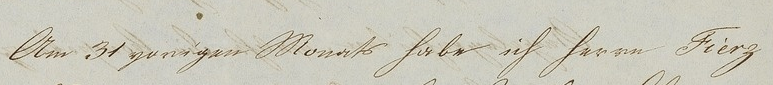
Am 31 vorigen Monats habe ich Herrn Fierz
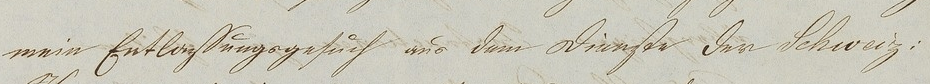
mein Entlassungsgesuch aus dem Dienste der Schweiz:
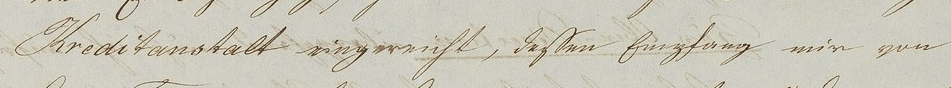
Kreditanstalt eingereicht, deßen Empfang mir von
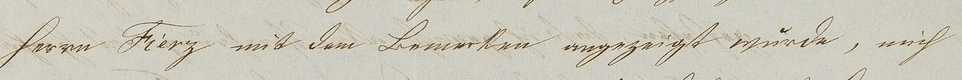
Herrn Fierz mit dem Bemerken angezeigt wurde, mich
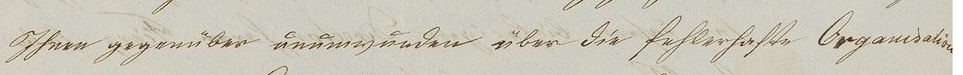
Ihnen gegenüber unumwunden über die fehlerhafte Organisation
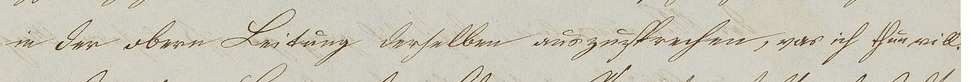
in der obern Leitung derselben auszusprechen, was ich thun will.
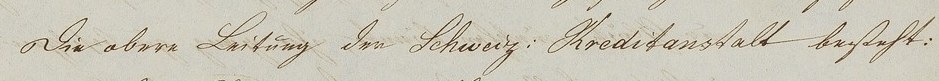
Die obere Leitung der Schweiz: Kreditanstalt besteht:
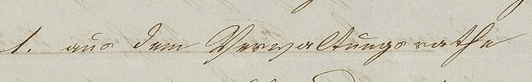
1. aus dem Verwaltungsrathe
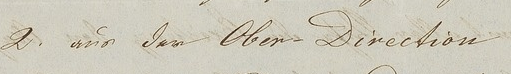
2. aus der Ober-Direction
